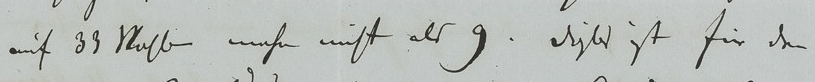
auf 33 Wahlen mehr nicht als 9. Dieses ist für den
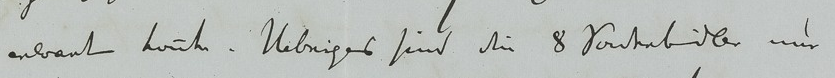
erwarten konnte. Uebrigens sind die 8 Sonderbündler nur
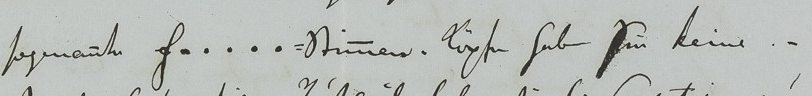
sogenannte f.....-Stimmen. Köpfe haben Sie keine. –
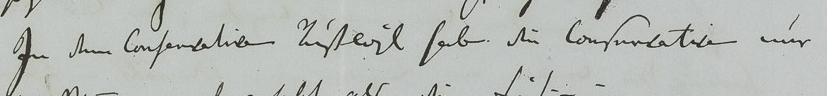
In dem Conservativen Rußwil haben die Conservativen nur
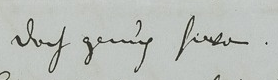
Doch genug hievon.
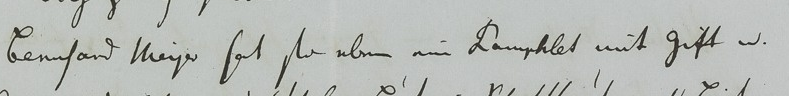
Bernhard Meyer hat so eben ein Pamphlet mit Gift u.
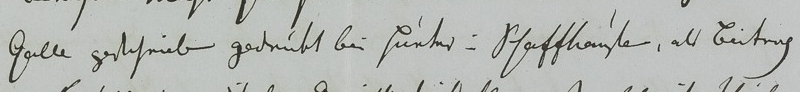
Galle geschrieben gedrukt bei Hurter – in Schaffhausen, als Beitrag
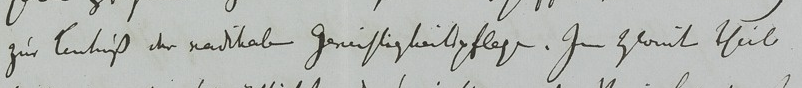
zur Kentniß der radikalen Gerechtigkeitspflege. Im zweiten Theil
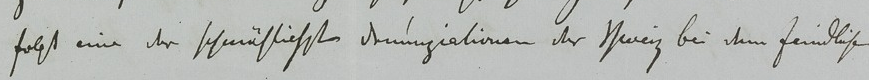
folgt eine der schmählichsten Denunziationen der Schweiz bei dem feindlichen
